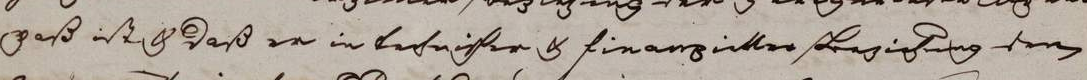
paß ist & daß er in technischer & finanzieller Beziehung den
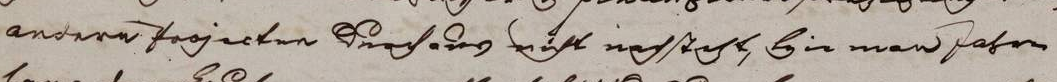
andern Projecten durchaus nicht nachsteht, wie man Jahre-
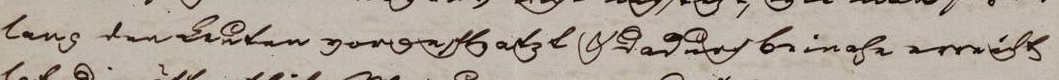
lang den Leuten vorgeschwatzt & dadurch beinahe erreicht
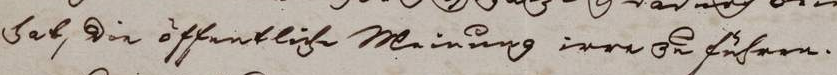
hat, die öffentliche Meinung irre zu führen.
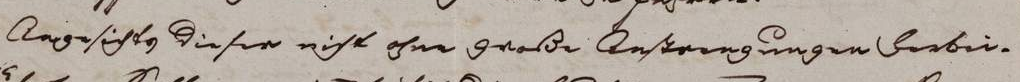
Angesichts dieser nicht ohne große Anstrengungen herbei-
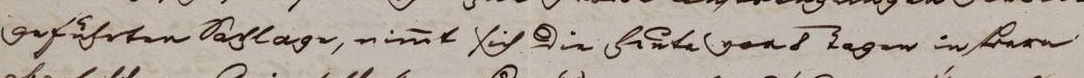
geführten Sachlage, nimmt sich die heute vor 8 Tagen in Bern
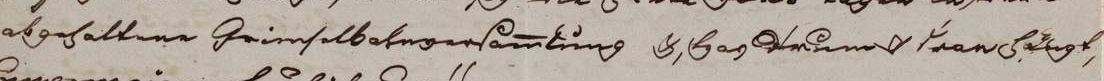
abgehaltene Grimsel bahnversammlung &, was d'rum und d'ran hängt,
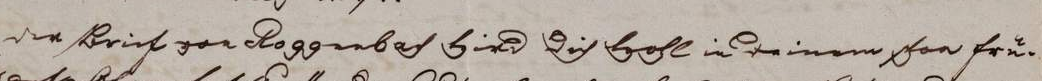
Der Brief von Roggenbach wird Dich wohl in Deinem schon frü-
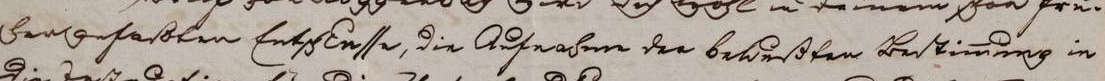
her gefaßten Entschlusse, die Aufnahme der bewußten Bestimmung in
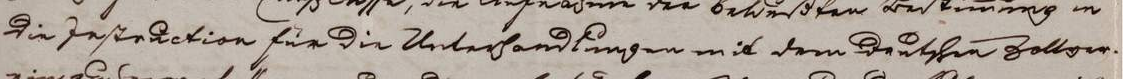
die Instruction für die Unterhandlungen mit dem Deutschen Zollver-
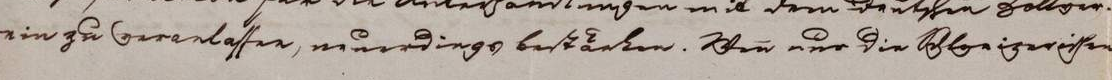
ein zu veranlassen, neuerdings bestärken. Wenn nur die Schweizerischen
